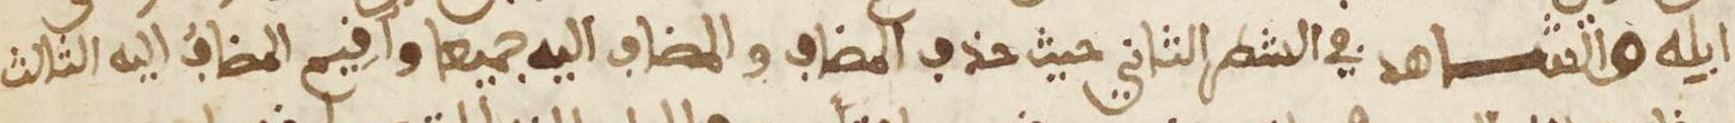ابله و الشاهد في الشطر الثاني حيث حذف المضاف و المضاف اليه جميعا و أقيم المضاف اليه الثالث
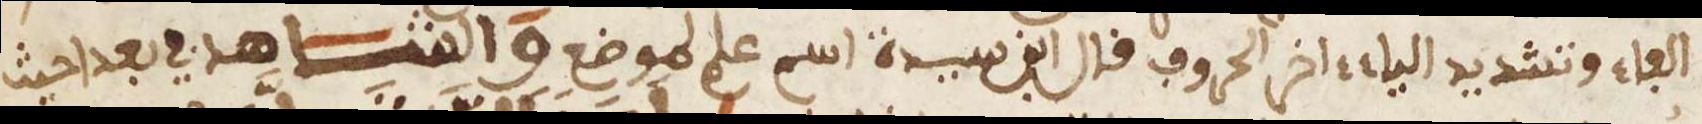الفاء و تشديد الياء ءاخر الحرف قال ابن سيدة اسم علم لوضع و الشاهد في بعدا حيث
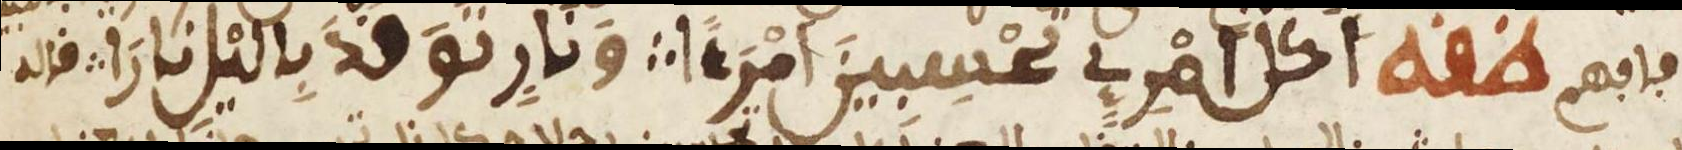فافهم ظفه أكل امرئ تحسبين امرءا و نار توقد باليل نارا قاله
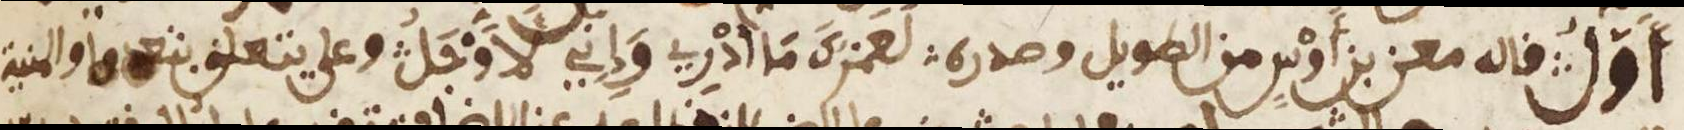أول قاله معن بن أوس من الطويل و صدره لعمرك ما أدري و إني لأوجل و على يتعلق بتعدوا و المنية
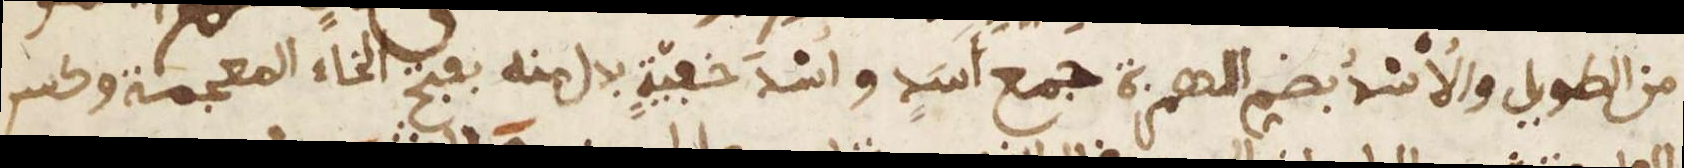من الطويل و الأسد بضم الهمزة جمع أسد و اسد خفية بدل منه بفتح الخاء المعجمة وكسر
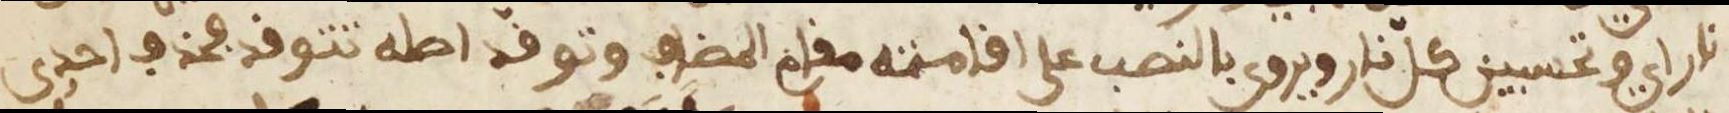نار اي و تحسبين كل نار و يروى بالنصب على افامته مقام المضاف و توقد اصله تتوقد فحذف احدى
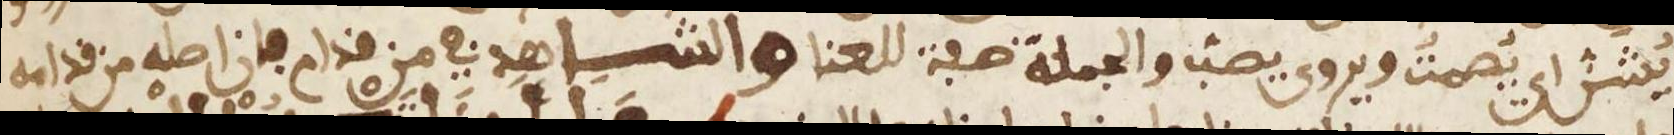يشن اي يصمت و يروى يصب و الجملة صفة للعنا و الشاهد في من قدام فان اصله من قدامه
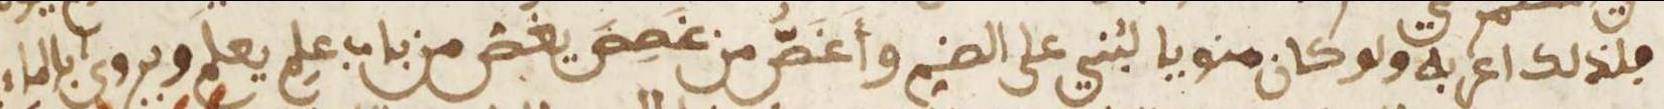فلذلك اعربه و لو كان منويا لبني على الضم وأغص من غصص يغص من باب علم يعلم و يروى بالماء
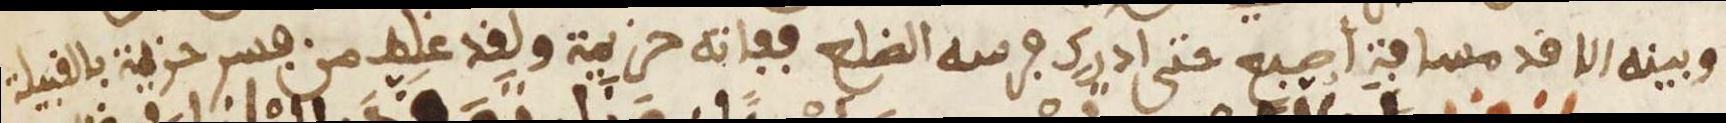و بينه الا قد مسافة أصبع حتى ادرك فرسه الضلع ففاته حزيمة و لقد غلط من فسر حزيمة بالقبيلة
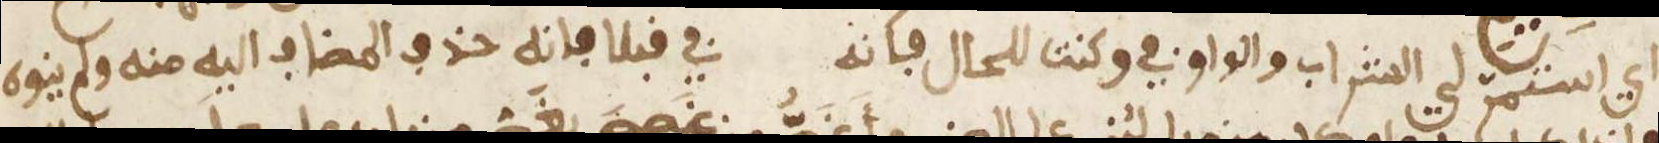اي استمر لي الشراب و الواو في و كنت للحال فانه في قبلا فانه حذف المضاف اليه منه و لم ينوه
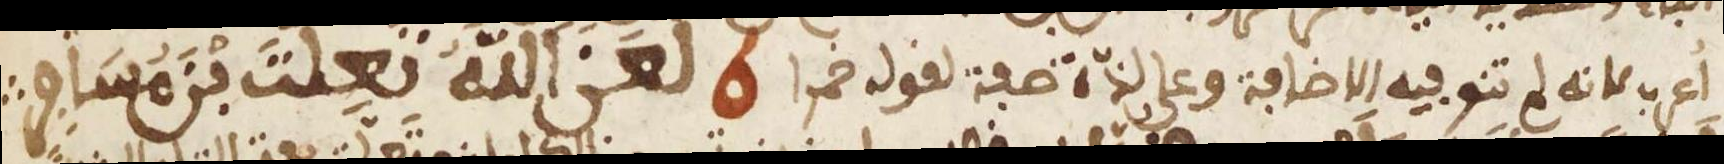اعرب كانه لم تنو فيه الاضافة و على لذة صفة لقوله خمرا ه لعن الله تعلت بن مسافر
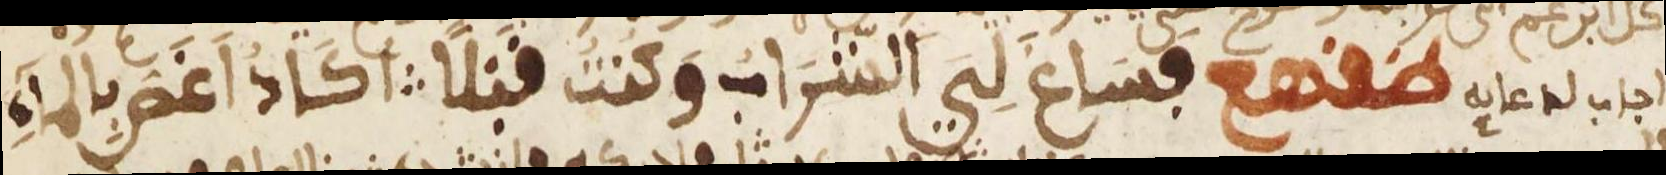اجاب لدعائه ظفهع فساغ لي الشراب و كنت قبلا أكاد اغص بالماء
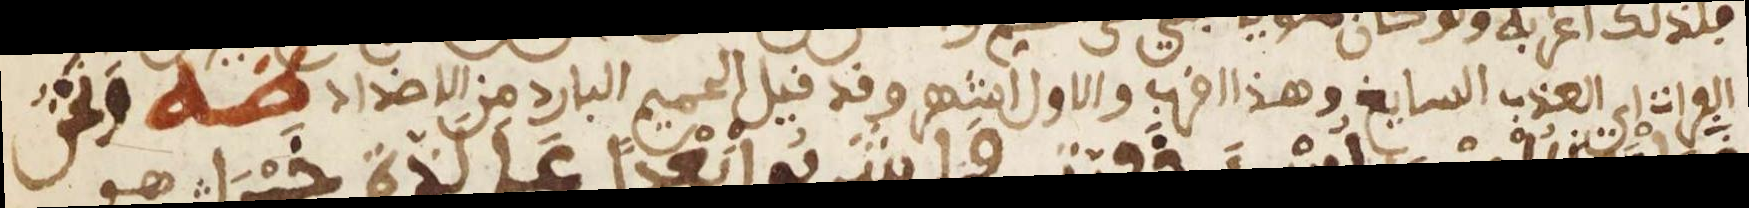الفرات اي العذب السايغ و هذا اقرب و الاول اشهر و قد قيل الحميم البارد من الاضداد ظه و نحن
